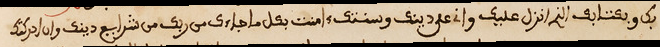بك وبكتابك الذي انزل عليك وانى على دينك وسنتك ءامنت بكل ما جاءك من ربك من شرايع دينك وان ادركتك
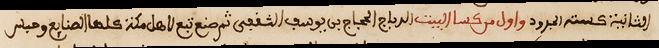الثانية كسته الجرود واول من كسا البيت الدباج الحجاج بن يوسف الثقفى ثم صنع تبع لاهل مكة كلها الصنائع وحبس
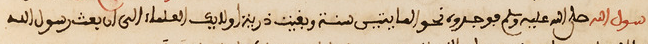سول الله صلى الله عليه وسلم فوجدوه نحو المايتين سنة وبقيت ذرية اولايك العلماء الى ان بعث رسول الله
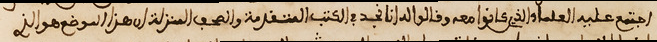اجتمع عليه العلماء الذين كانوا معه وقالوا له انا نجد في الكتب المتقدمة والصحف المنزلة ان هذا الموضع هو الذي
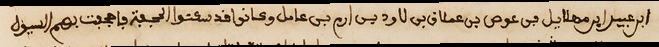ابن عبيد ابن مهلايل فن عوص بن عملاق بن لاود بن ارم بن عامل وكانوا قد سكنوا الجحفة فاجحفت بهم السيول
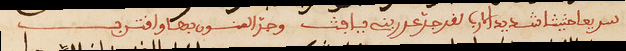سريعا حثيثا شديد الارب لقد جدّ عدربنى يافث وجدّ المنون بها واقترب
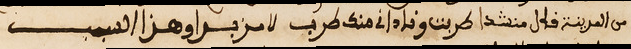من المدينة قال منشدا طربت ونادانى منك طرب لامر بدا وهذا السبب
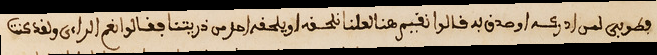فطوبى لمن ادركه او صدق به قالوا نقيم هنا لعلنا نلحقه او يلحقه احد من ذريتنا فقالوا نعم الراءى ولقد كنت
